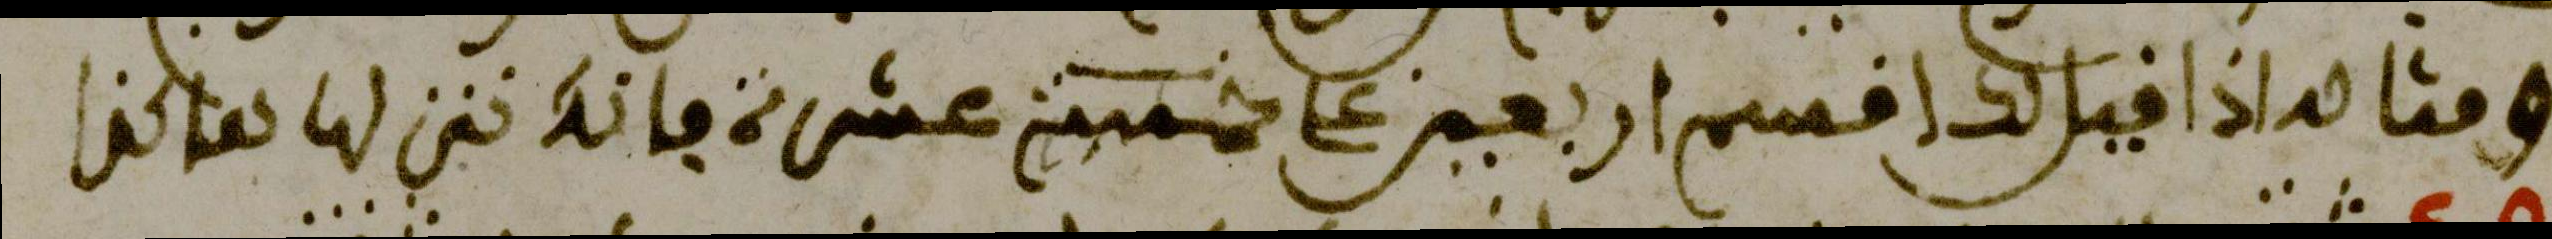ومثاله اذا قيل لك اقسم اربعين على خمسة عشرة فانه تزلها هاكذا
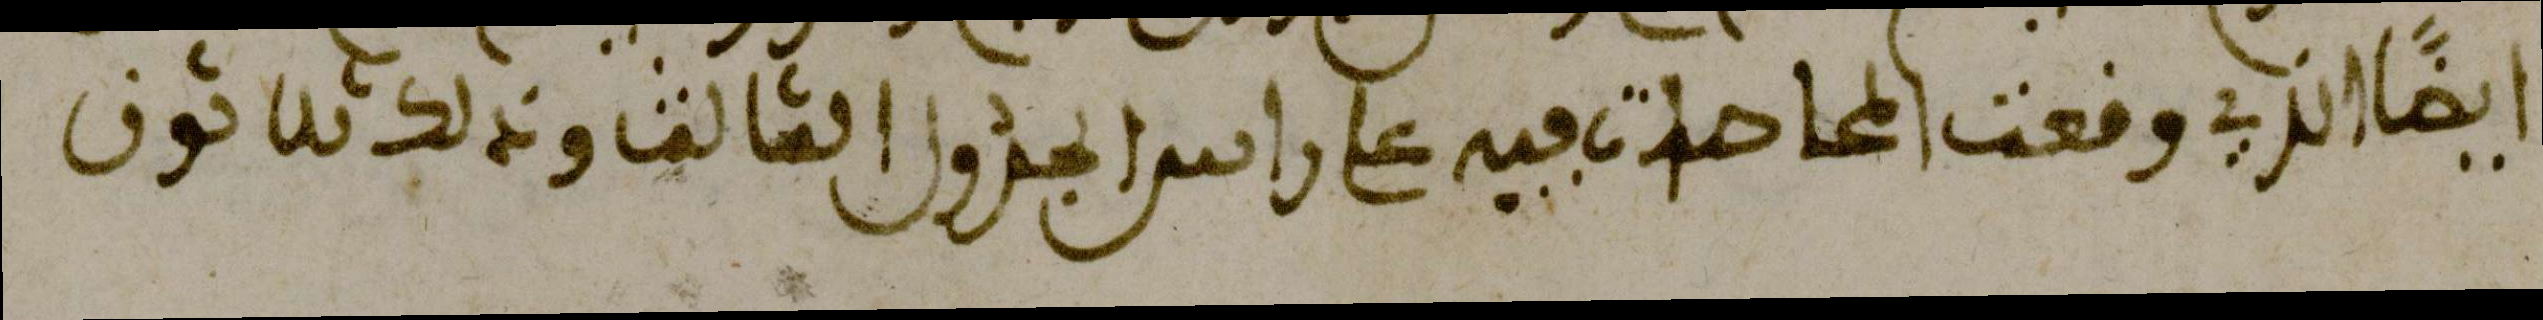أيضًا الذي وقعت المحاصات فيه على راس الجدول الثالث وذلك ثلاثون
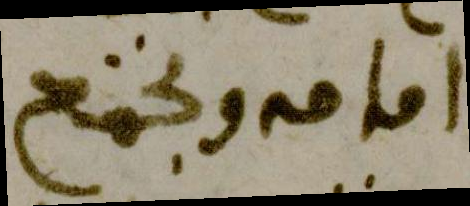امامه وتجمع
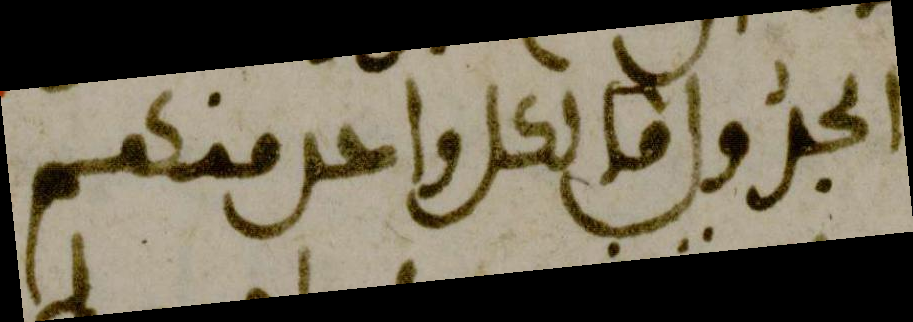الجدول ما لكل واحد منهم
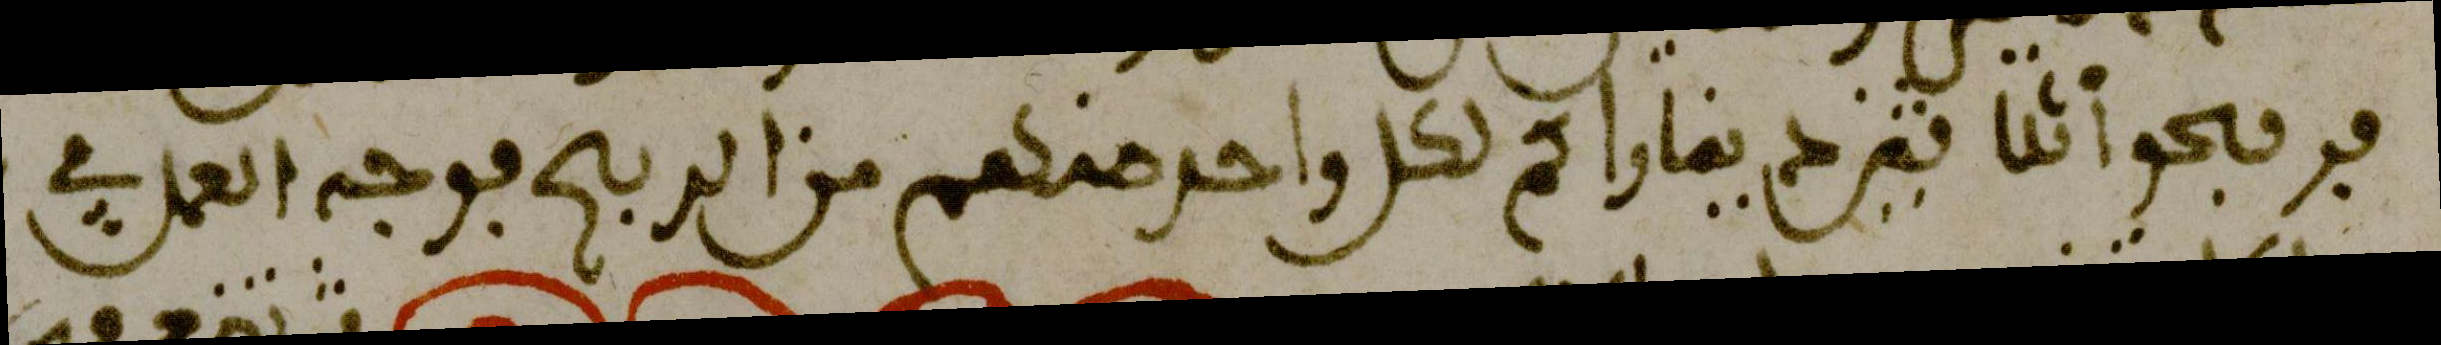فربحوا ثلاثين دينارا كم لكل واحد منهم من الربح فوجه العمل في
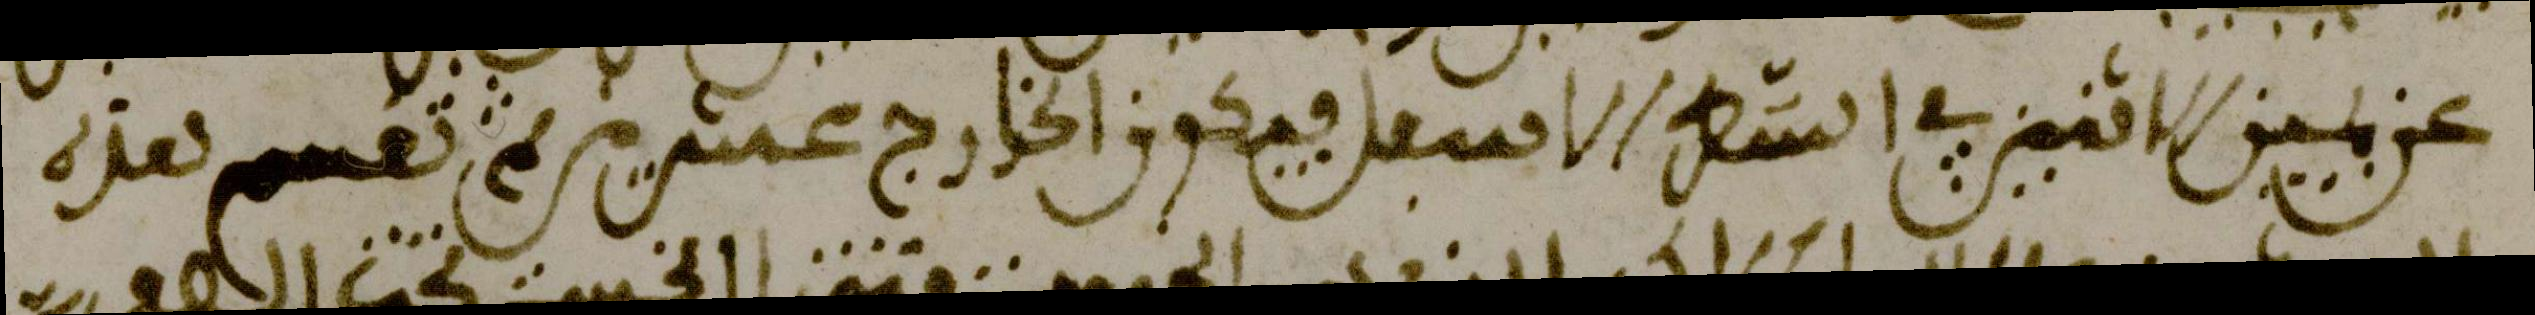عن يمين الاثنين في السًطر الاسفل فيكون الخارج عشرين ثم تقسم هذه
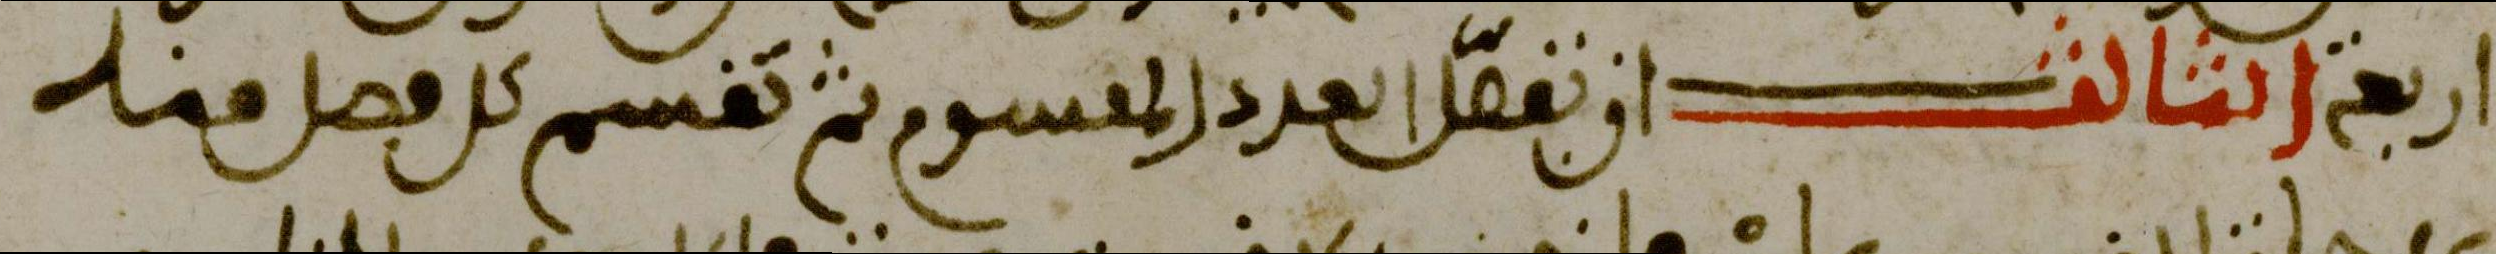اربعة الثالث ان تفصّل العدد المقسوم ثم تقسم كل فصل منه
